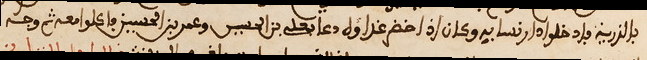بالذرية فادخلوا دار نسايه وكان اذا خضر غداوه دعا بعلى بن الحسين وعمر بن الحسين فاكلوا معه ثم وجه
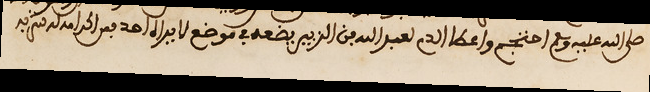صلى الله عليه وسلم واحتج واعطا الدم لعبد الله بن الزبير يضعه في موضع لا يراه احد فمن اكرامه له شربه
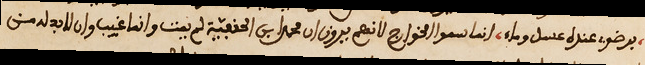برضوى عنده عسل وماء انما سموا الخوارج لانهم يرون ان محمد ابن الحنفية لم يمت وانما غيب وان لا بد له من
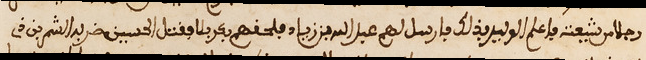رجلا من شيعة فاعلم الوليد فذلك فارسل لهم عبد الله من زياد فلحقهم بكر بلا فقتل الحسين ضربه الشمر بن ذى
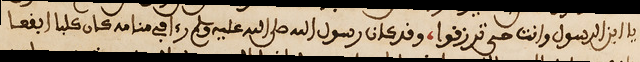يا ابن الرسول وانت حى ترزقوا وقد كان رسول الله صلى الله عليه وسلم رءا في منامه كان كلبا ابقعا
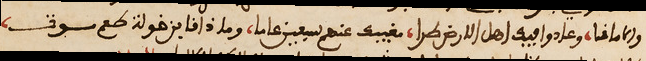والامانا وعادوا فيك اهل الارض طرا مغيبك عنهم سبعين عاما وما ذاقا بن خولة طعم موت
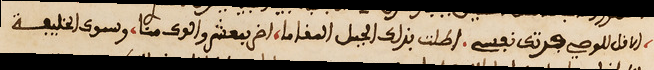الاقل للوصي فدتك نفسى اطلت بذلك الجبل المقاما اضر بمعشر والوك منا وسوك الخليفة
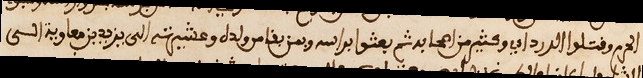الحرم قتلوا الدرداءي وكثير من اصحابه ثم بعثوا براسه وبمن بقا من ولده وعشيرته الى يزيد بن معاوية الى
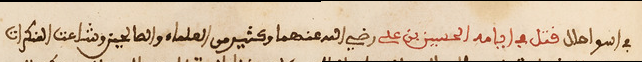في اسو احلل قتل ايامه الحسين بن على رضي الله عنهما وكثير من العلماء والصالحين وشاعت المنكرات
